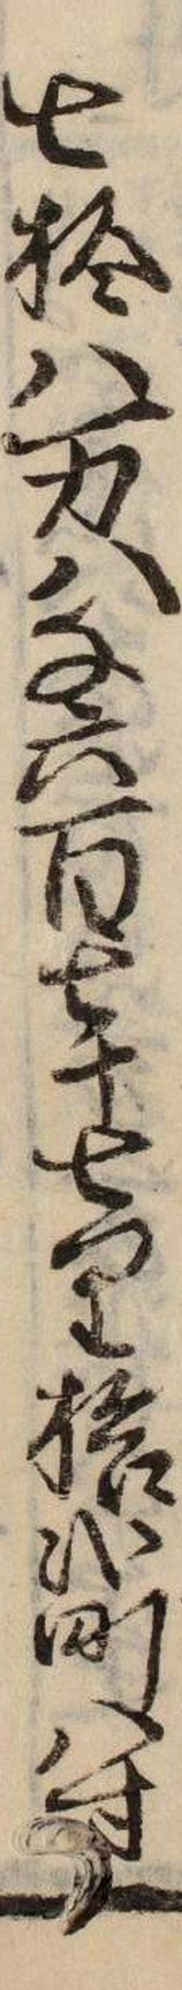七拾八万八千六百七十七里拾弐町八寸
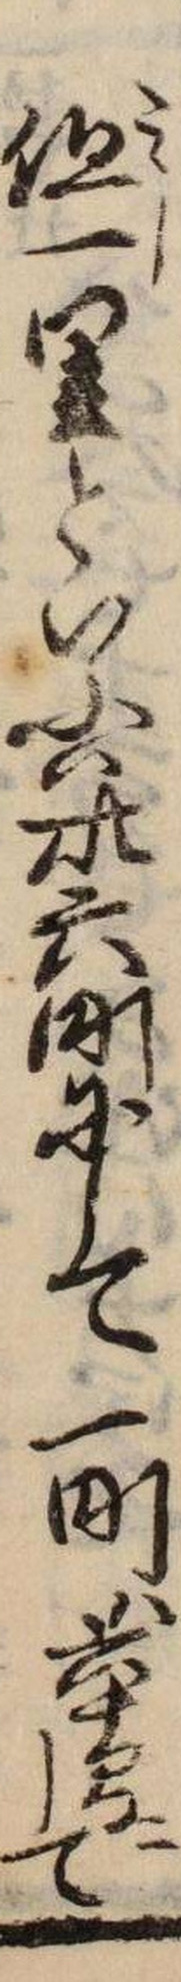但一里といふは卅六町にして一町は六十間にして
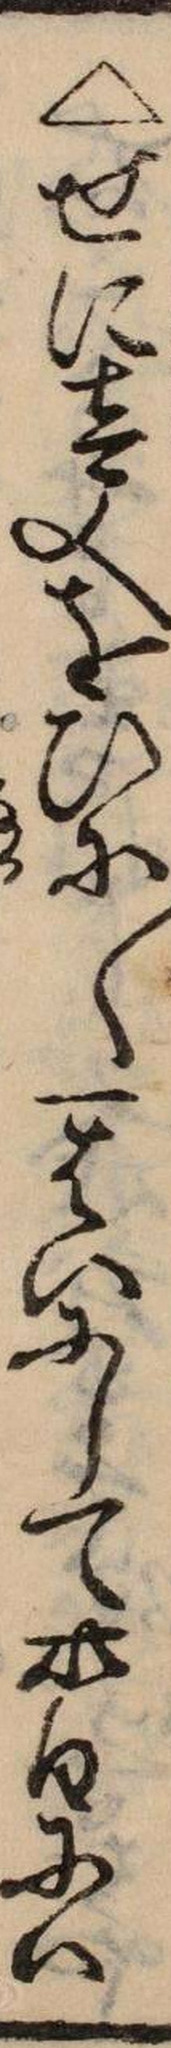△せに壱文をひにひに一はいにして卅日には
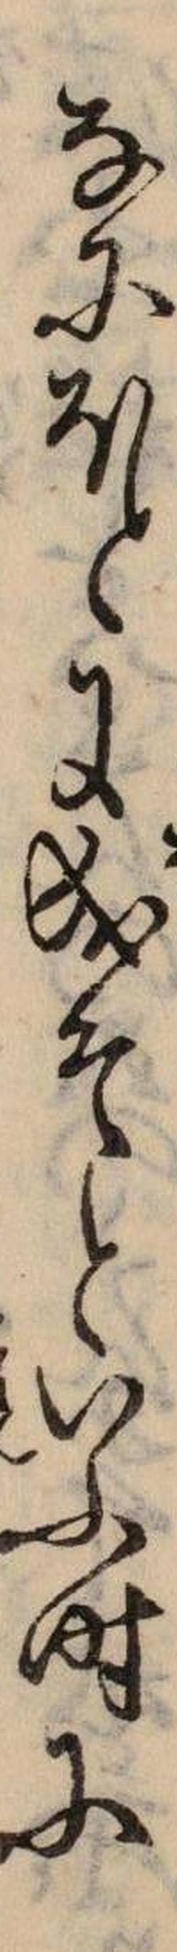なにほとに成そといふ時に
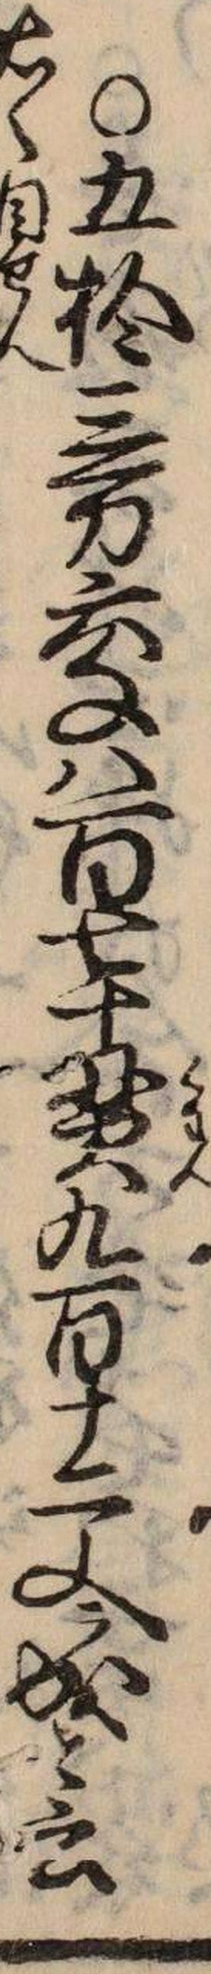○五拾三万六千八百七十貫九百十二丈に成と云
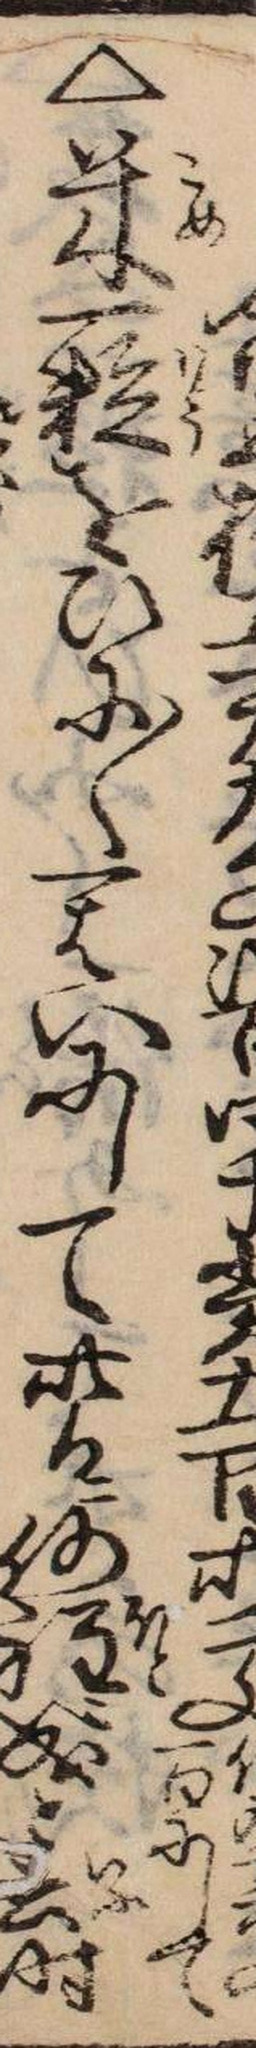△米一粒をひにひに一はいにして卅口何程に成と云時
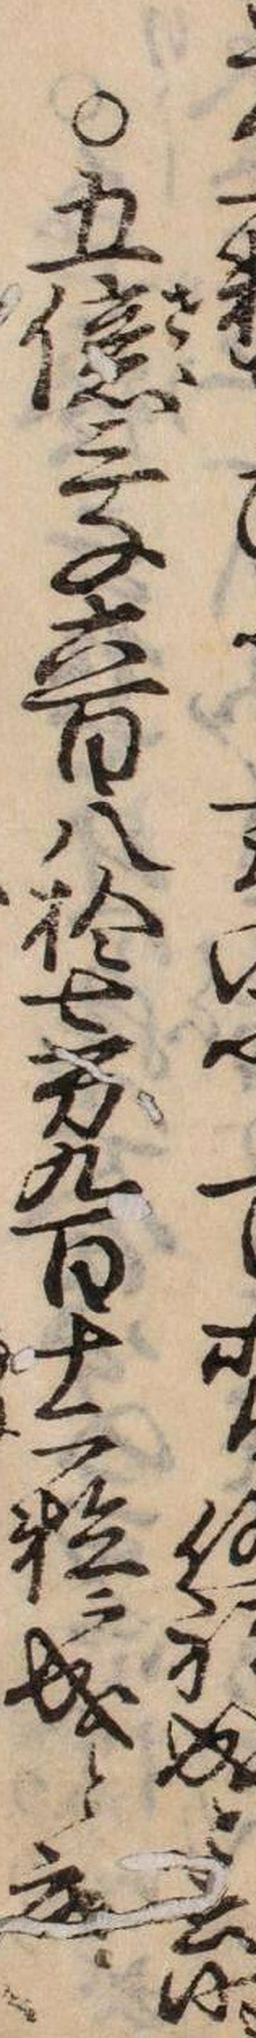○五億三千六百八拾七万九百十二粒に成と云
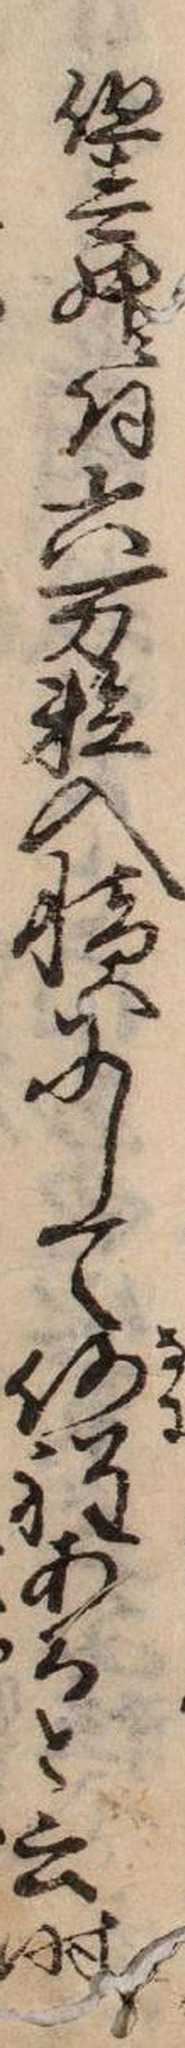但壱舛に付六万粒入精にして何程あると云時
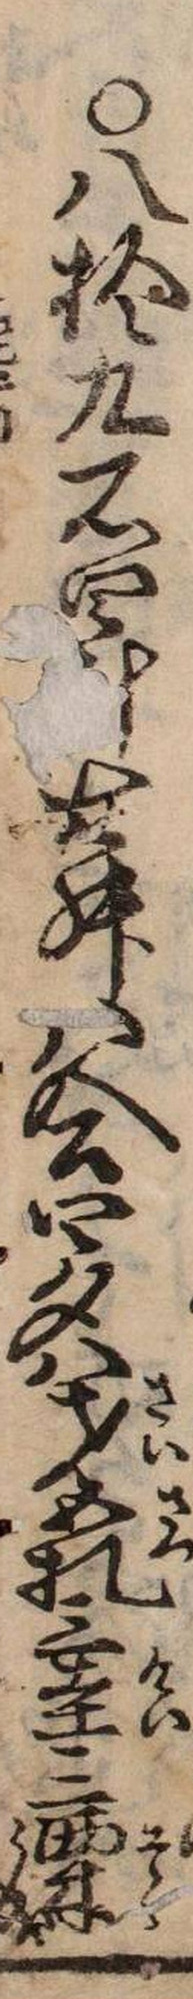○八拾九石四斗七升八合四勺八才五撮三圭三栗

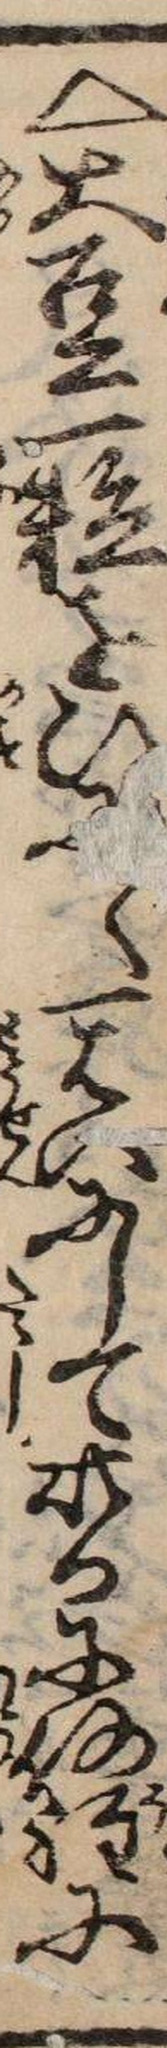△大豆一粒をひにひに一はいにしておるに何程に
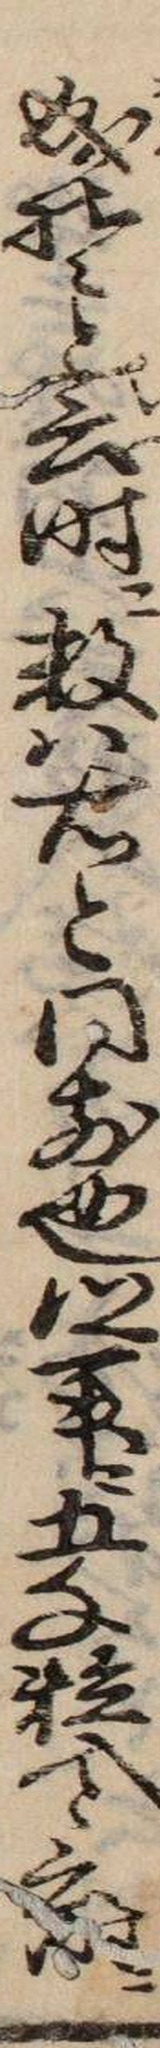成そも云時に数は右と同前也但？に五千粒人と云時に
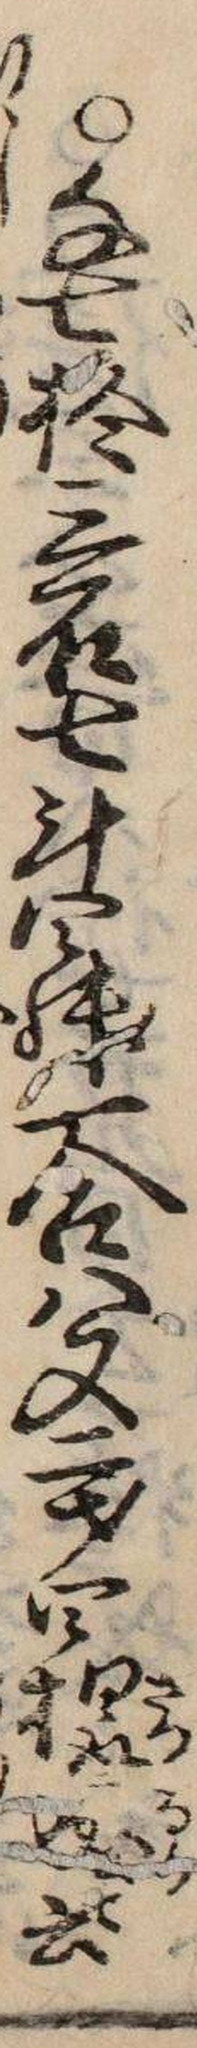○千七拾三石七斗四升五合八勺二才四撮成と云
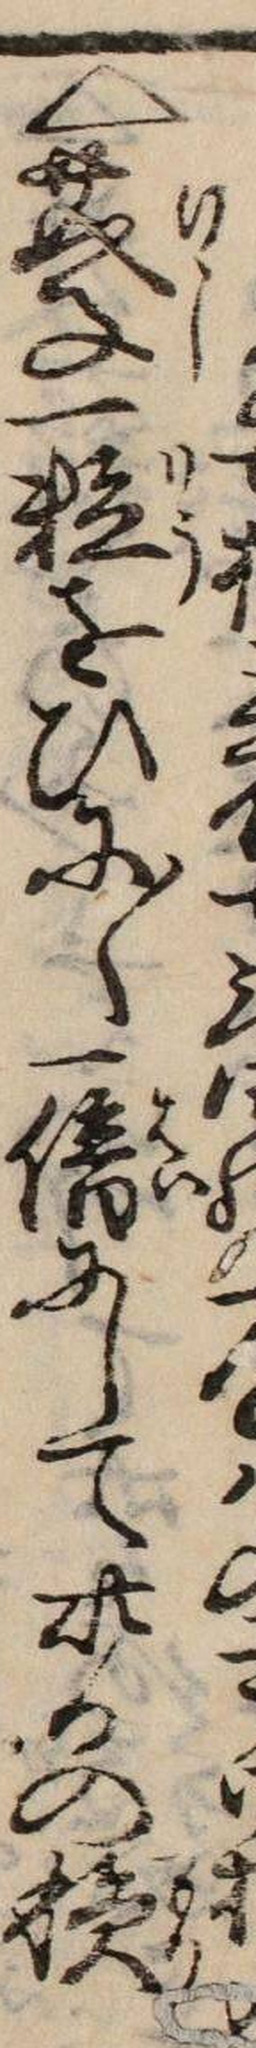△芥子一粒をひにひに一倍にして卅日の積
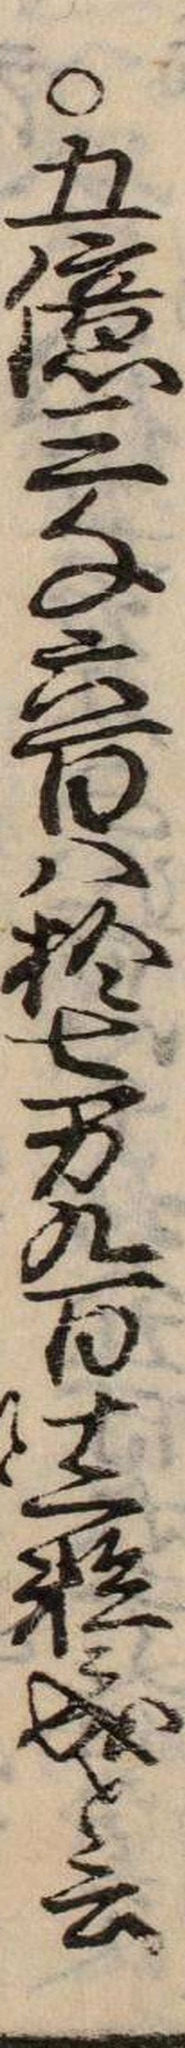○五億三千六百八拾七万九百十二粒に成と云
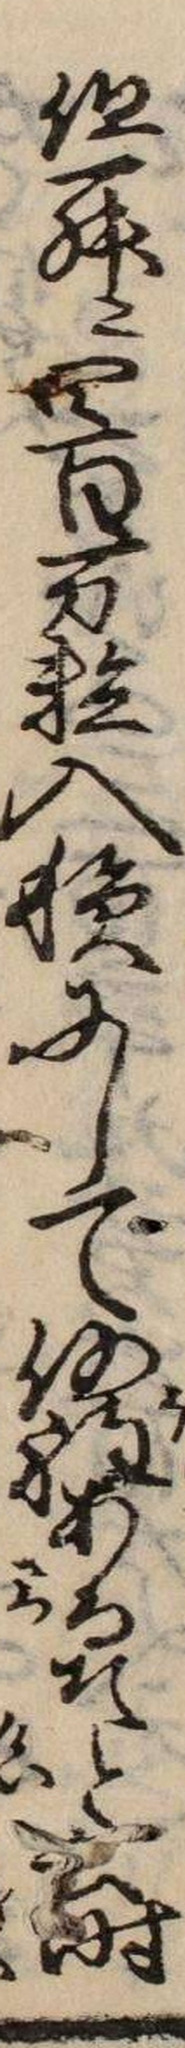但一升に四百万粒入積にしで何程あるなと云時
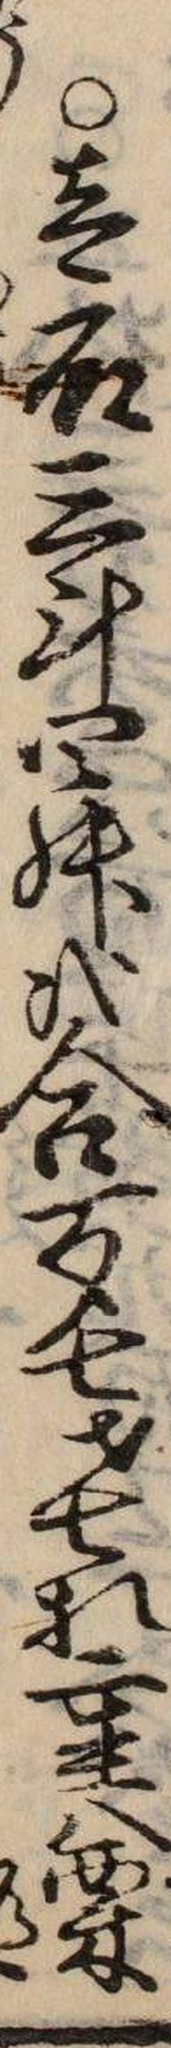○壱石三斗四升弐合万七才七撮二圭八粟有
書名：塵劫記（寛永11年自跋、京都府立京都学・歴彩館追貴8）
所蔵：京都府立京都学・歴彩館 国文学研究資料館
